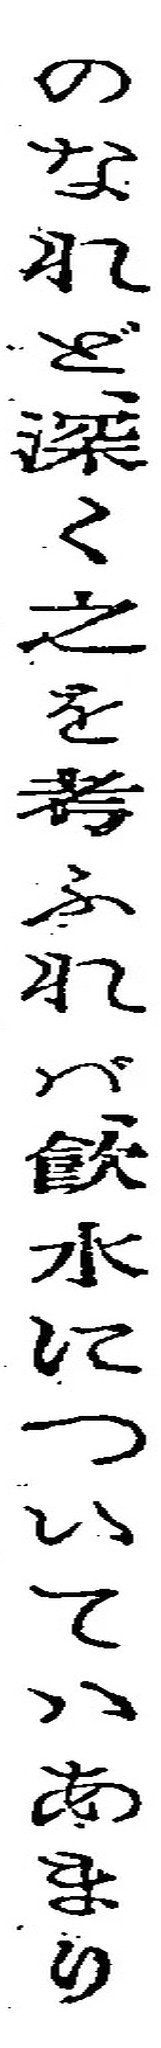のなれど、深く之を考ふれば、飲水についてはあまり

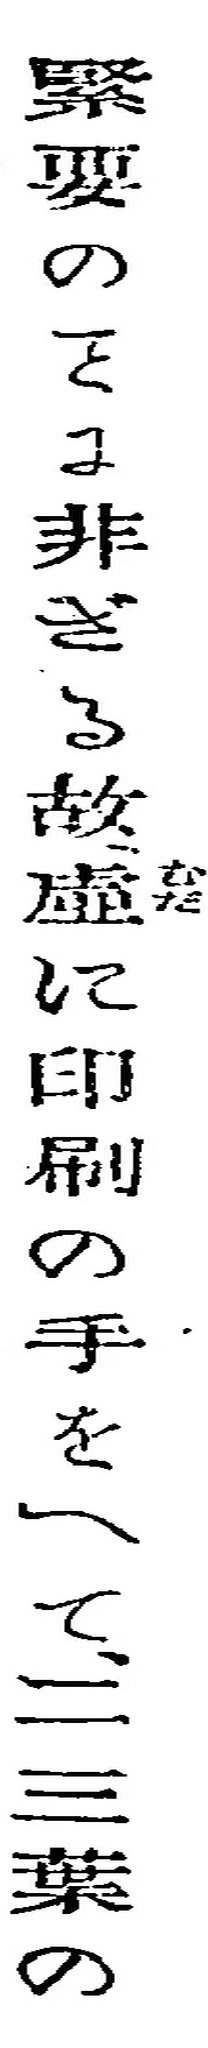緊要のことに非ざる故、虚に印刷の手をへて、二三葉の
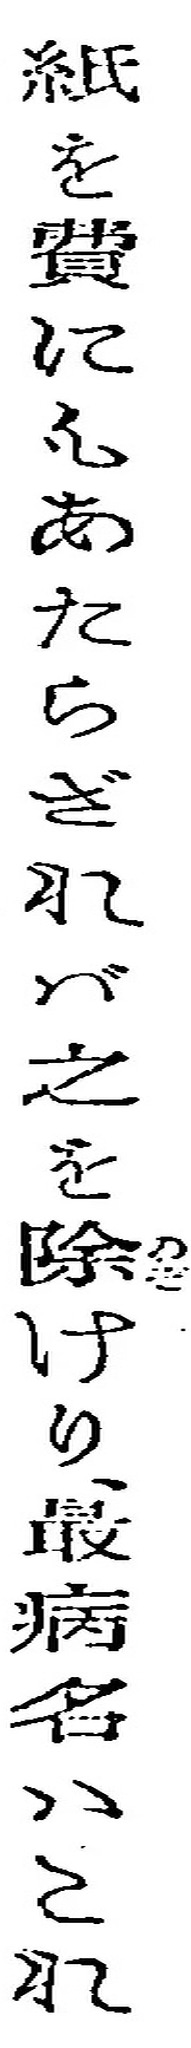紙を費にもあたらざれば之を除けり、最病名はこれ
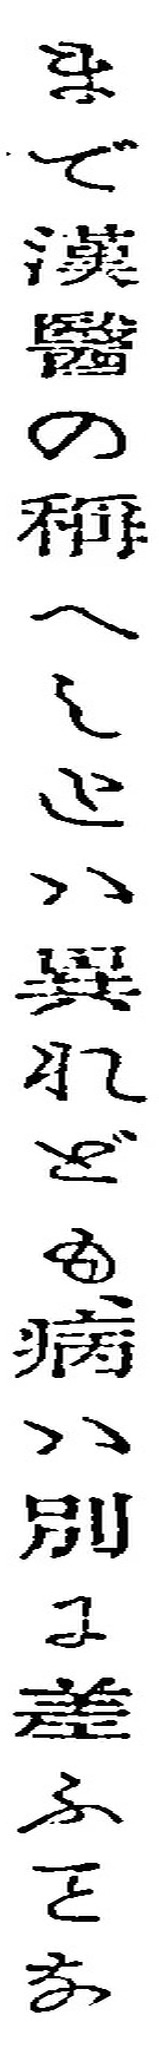まで漢醫の稱へしとは異れども、病は別に差ことな
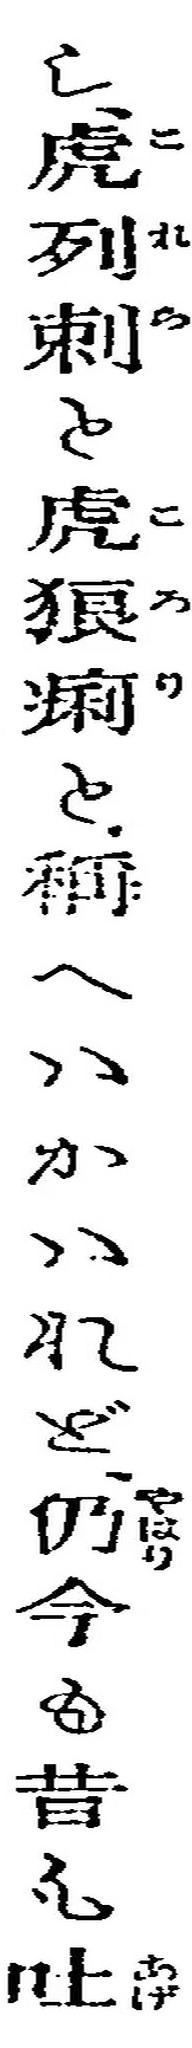し、虎列刺と虎列刺と、稱へはかはれど、仍今も昔も吐
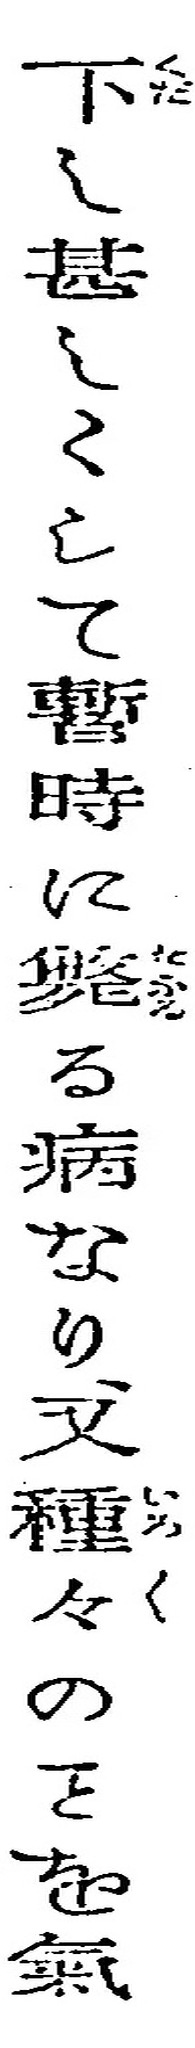下し甚しくして暫時に斃る病なり、又種々のことをも氣
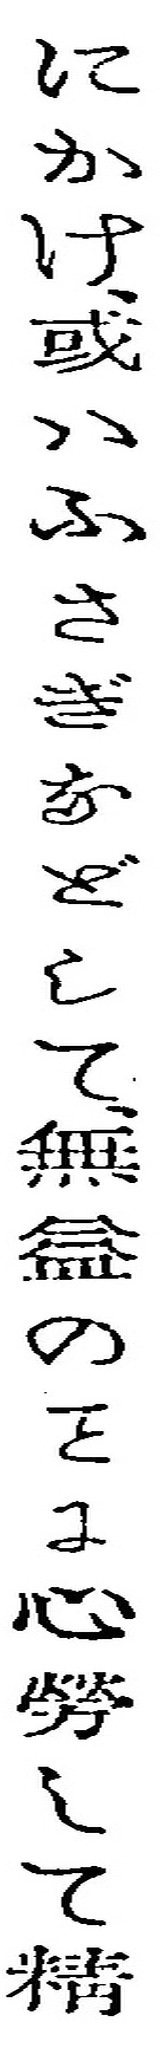にかけ、或はふさぎなどして無益のことに心労して精
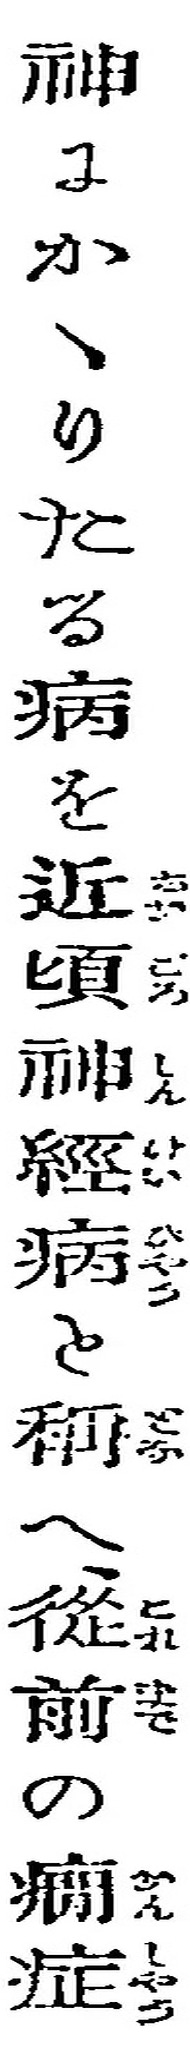神にかゝりたる病を近頃神経病と稱へ、従前の癇症
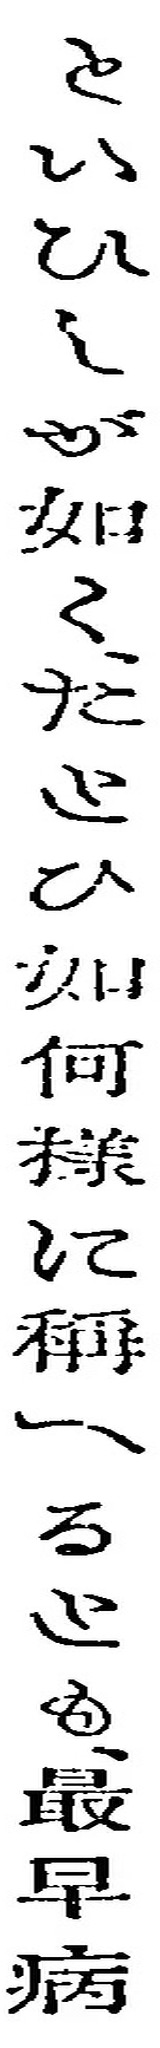といへしが如く、たとひ如何様に稱へるとも、最早病
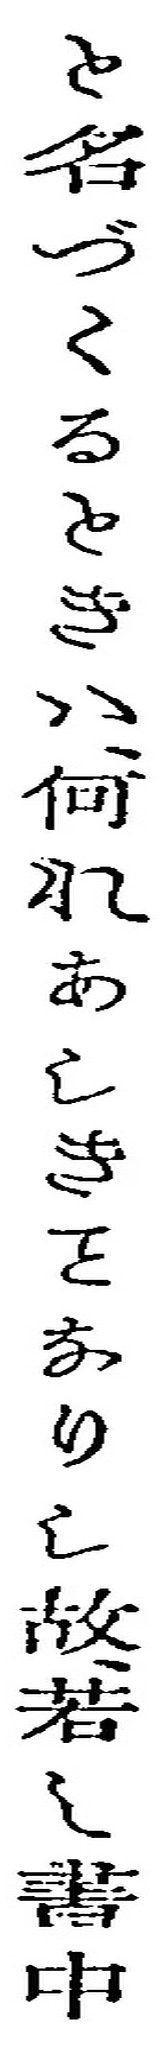と名づくるときは、何れあしきことなりし故、若し書中
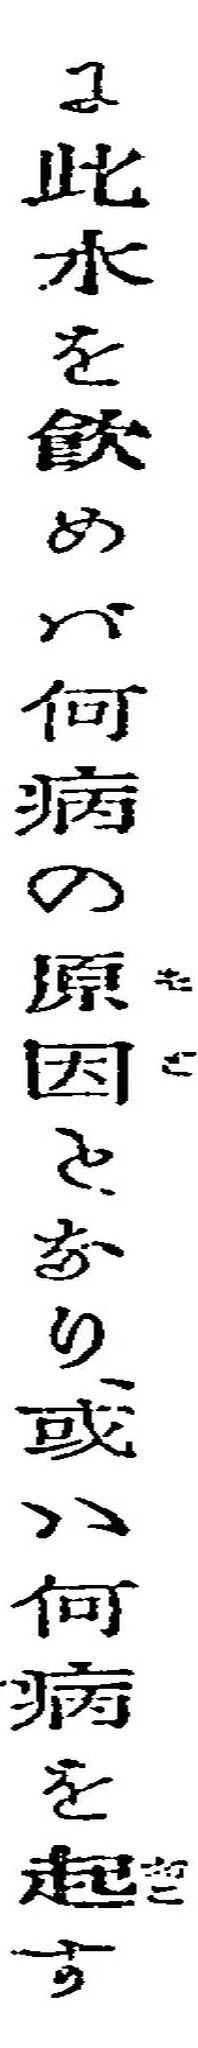に此水を飲めば何病の原因となり、或は何病を起す
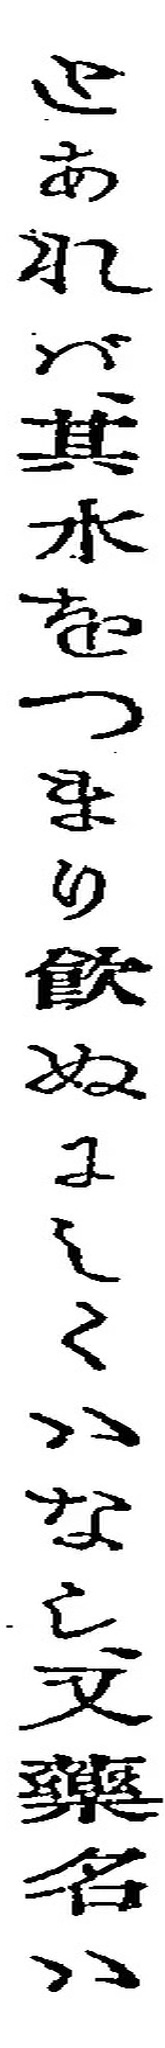とあれば、其みずをつまり飲ぬにしくはなし、又薬名は
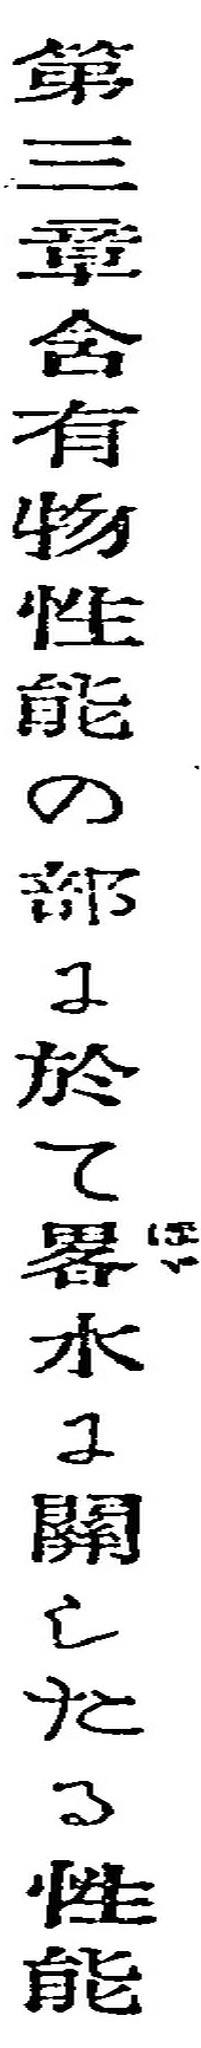第三章含有物性能の部に於て畧水に関したる性能
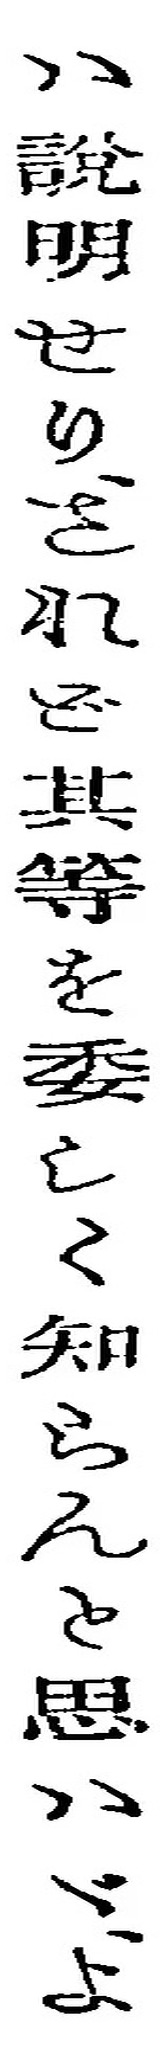は説明せり、されど其等を委しく知らんと思はゞ、よ
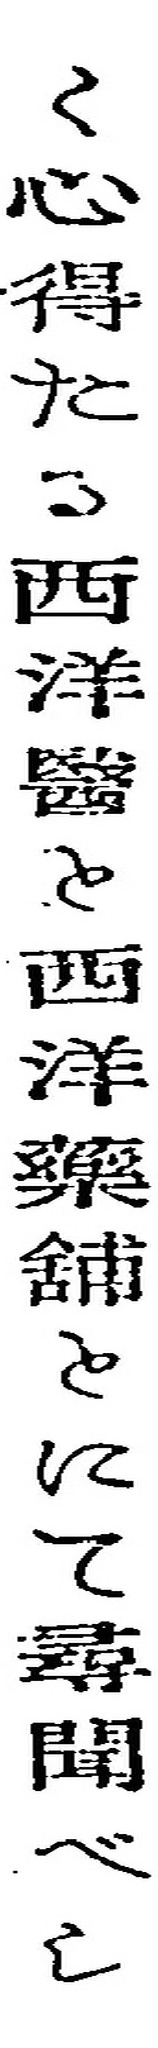く心得たる西洋医と西洋薬舗とにて尋問べし
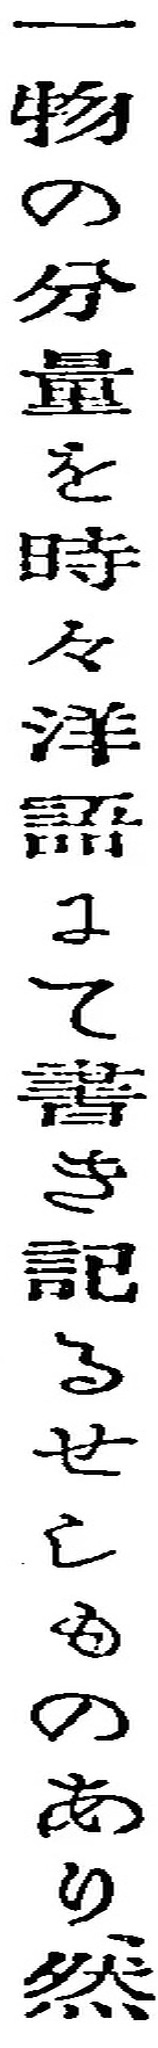一物の分量を時々洋語にて書き記るせしものあり、然
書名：飲水の心得 : 伝染病の予防
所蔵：国立国会図書館 National Diet Library, JAPAN
